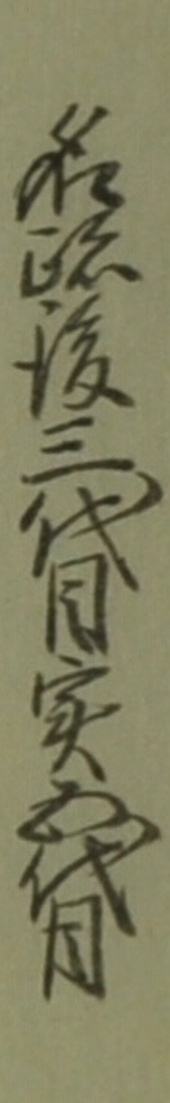名跡後三代目実五代目
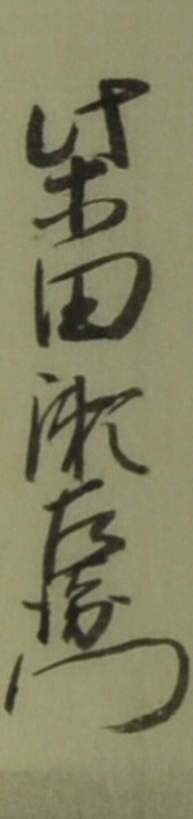柴田瀬左衛門

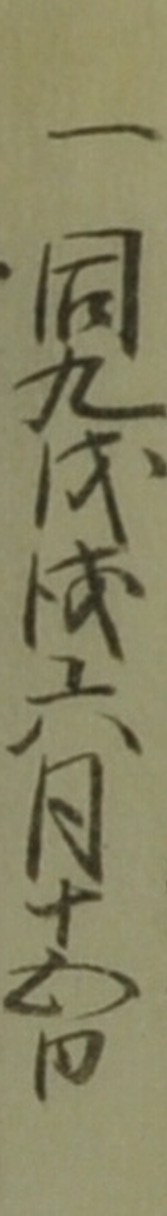一同九戊戌六月十五日
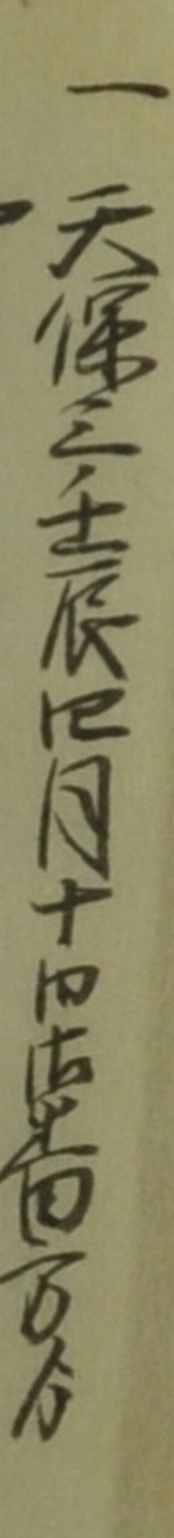一天保三壬辰四月十日御番方ゟ
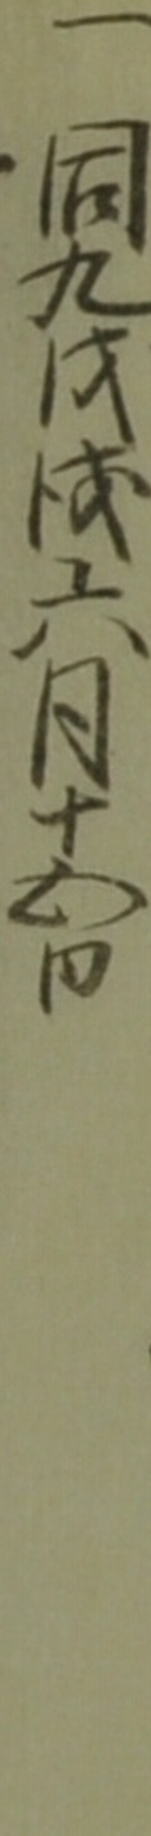一同九戊戌六月十五日
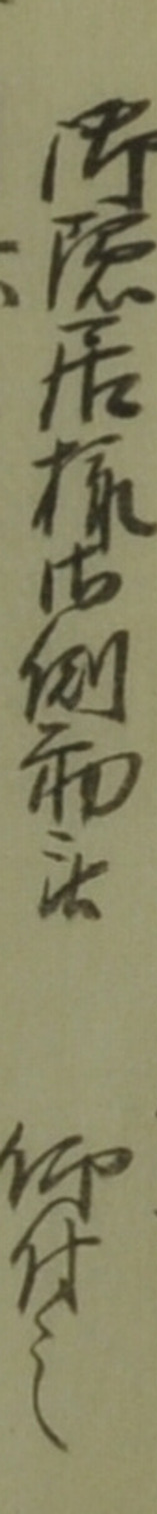御隠居様御側勤被仰付之
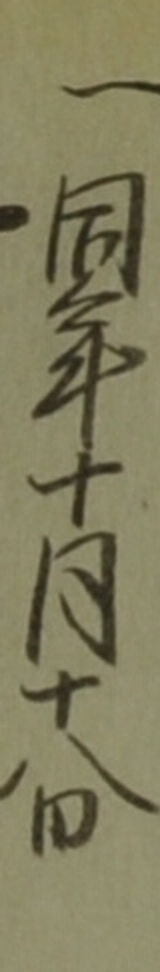一同年十月十八日
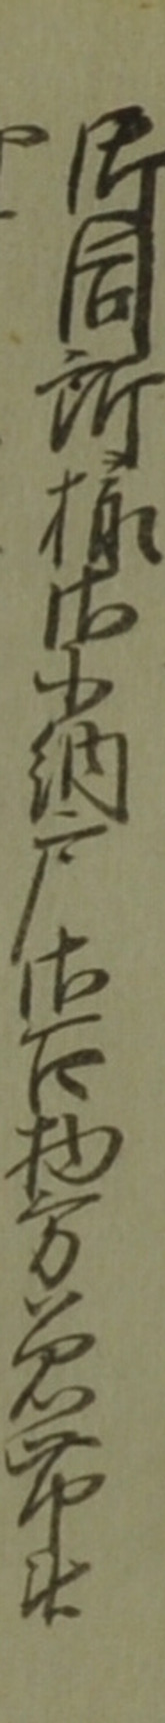御同所様御小納戸御召物方兼帯被
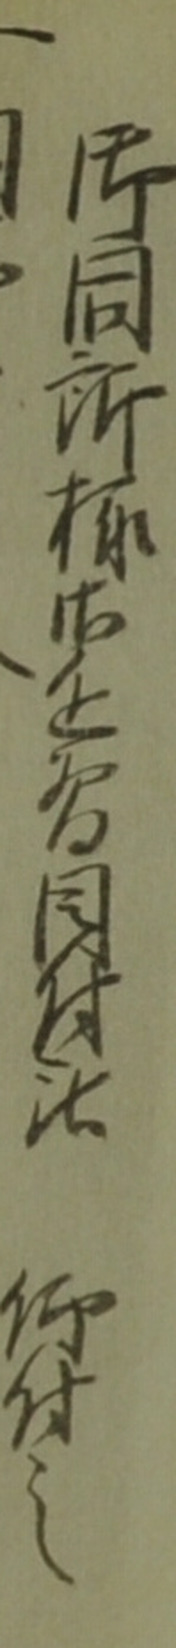御同所様御近習目付被仰付之
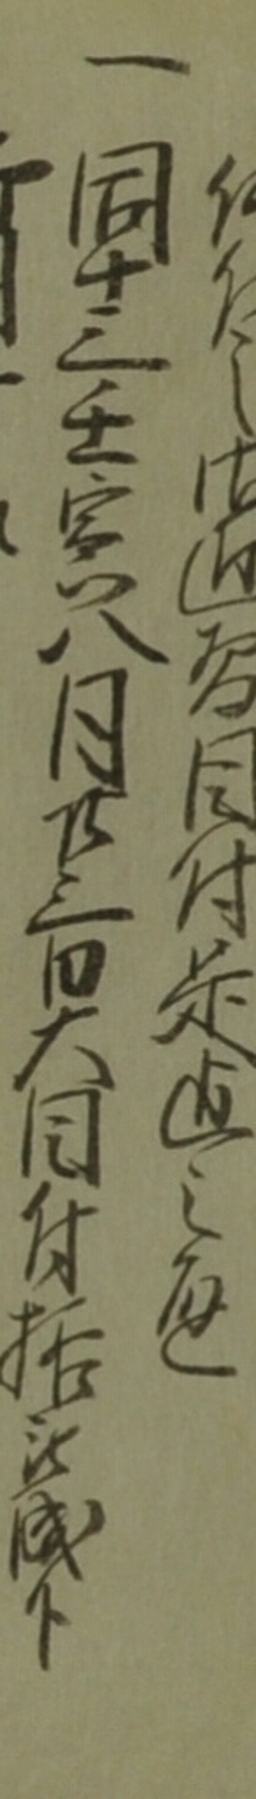一同十三壬寅八月廿三日大目付格被成下
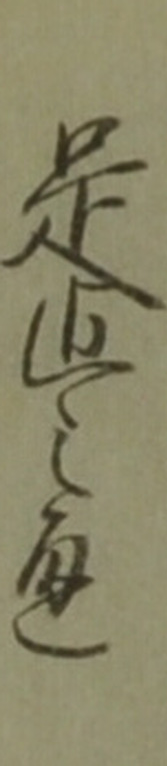是迄之通
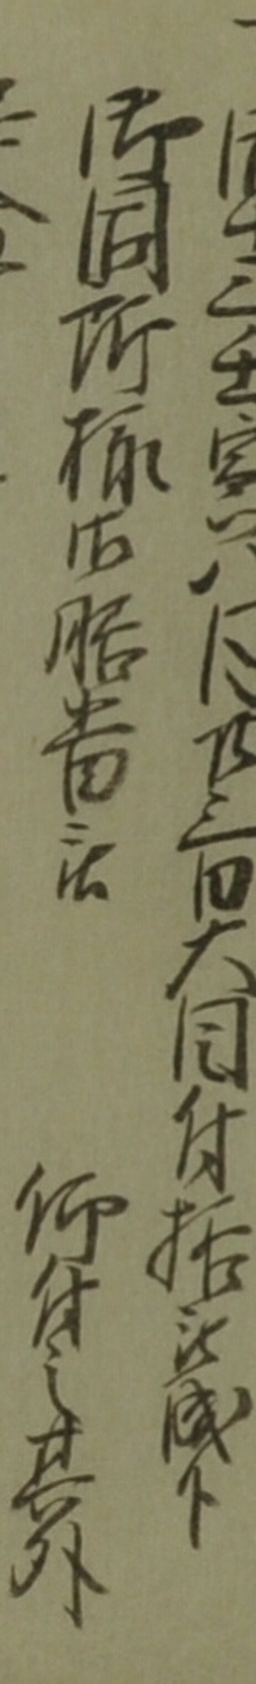御同所様御膳番仰付之其外
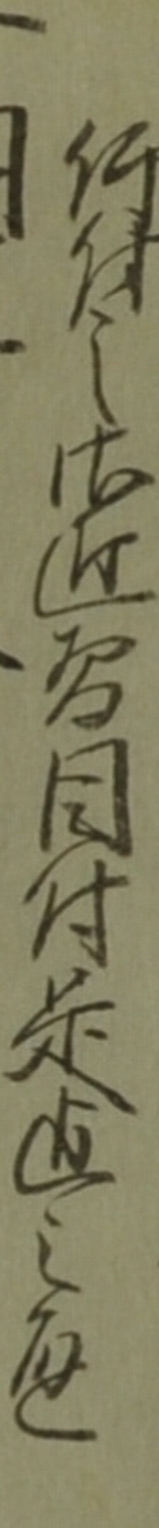仰付之御近習目付是迄之通
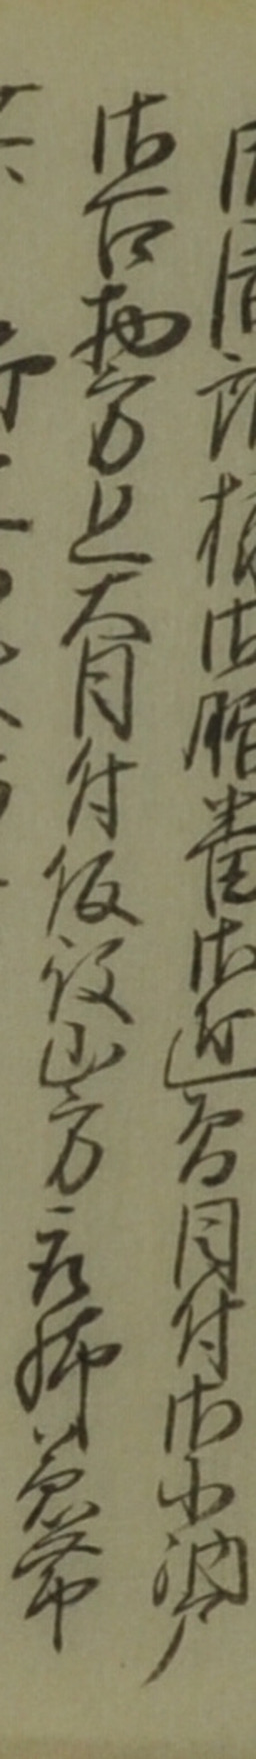御召物方且大目付仮役山方取締り兼帯
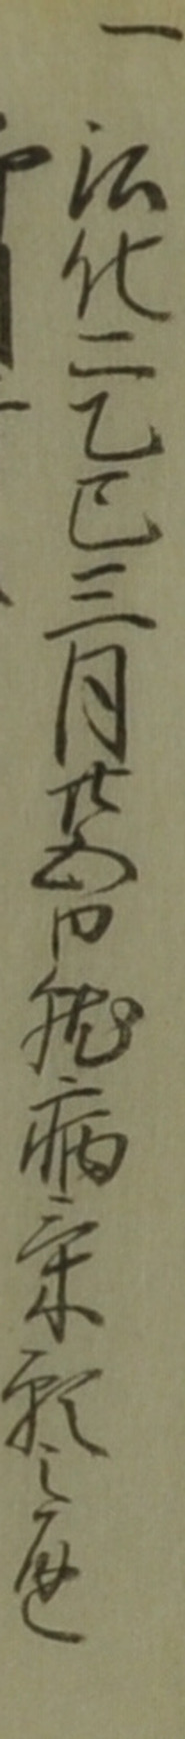一弘化二乙巳三月廿五日就病気願之通
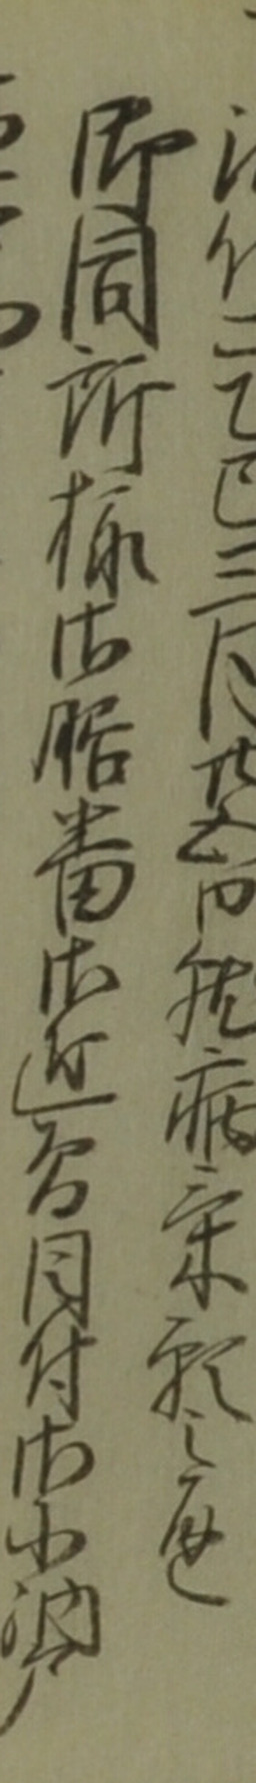御同所様御膳番御近習目付御小納戸
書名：諸御役代々録（五）
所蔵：伊那市立高遠町図書館・合同会社AMANE
